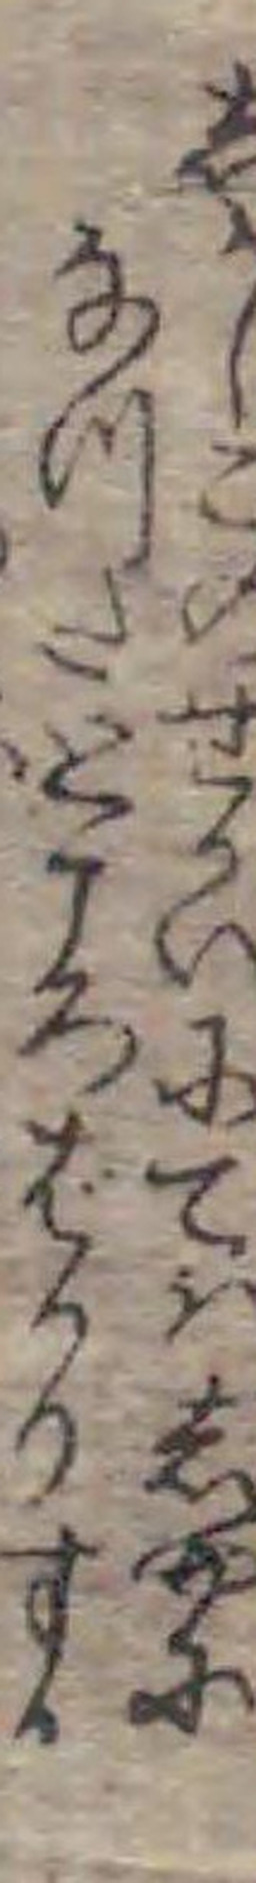なつたところばかりする
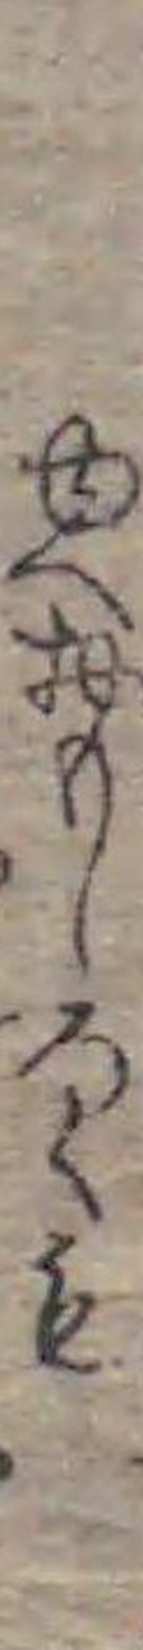ゆへおもしろくも
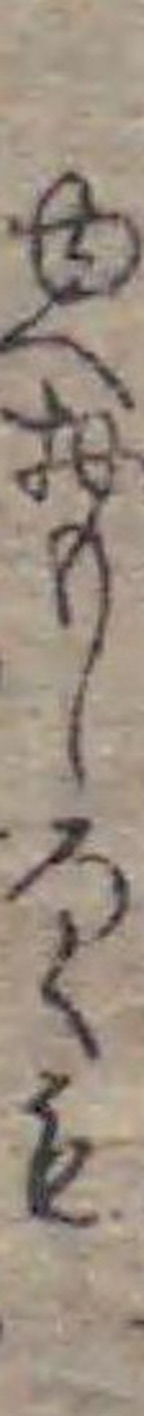ゆへおもしろくも
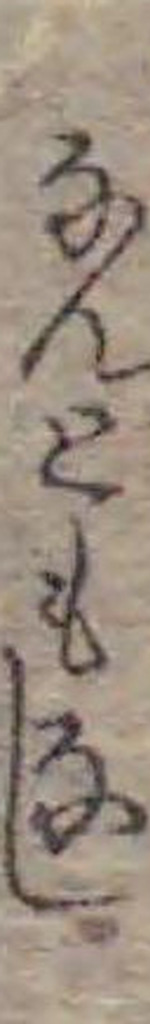なんともなし
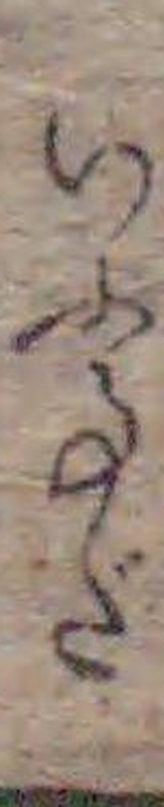いふ事だ
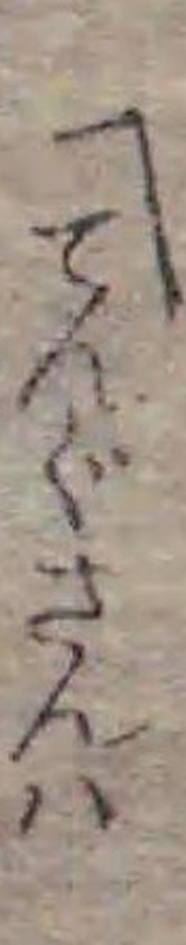〽てんぐさんは
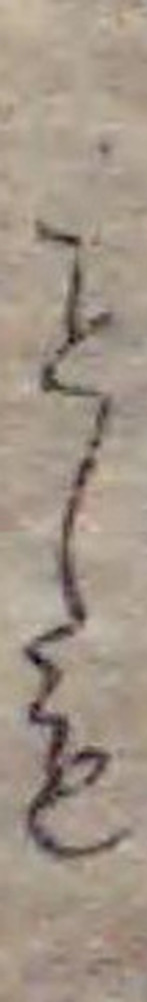ことしも
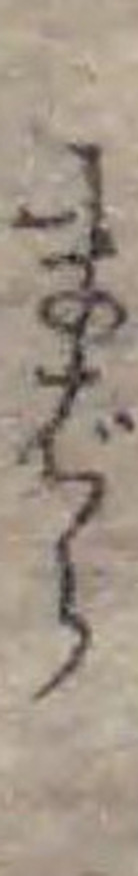まばら
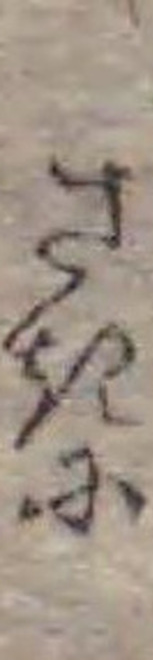さきに
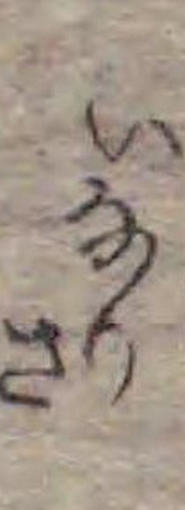いなり
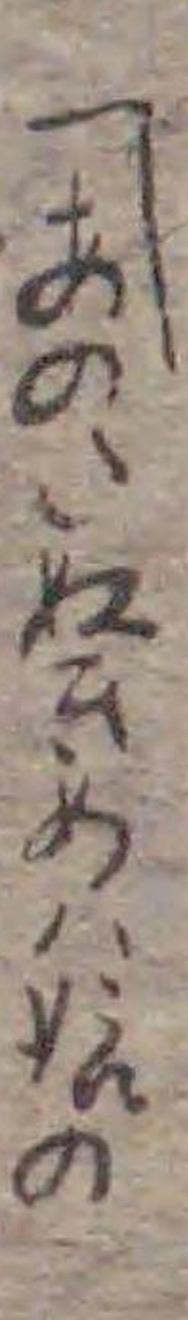〽あのたぬきめは娘の
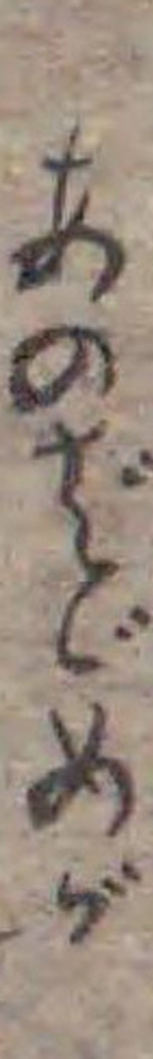あのばじめが
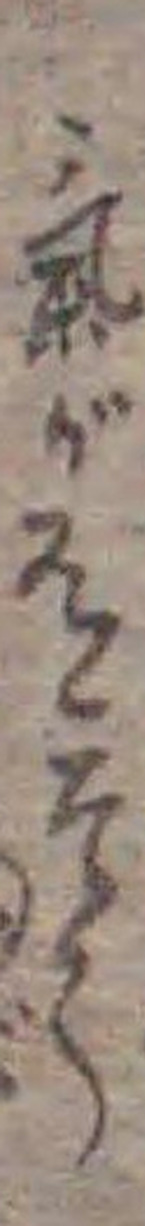気が有そう

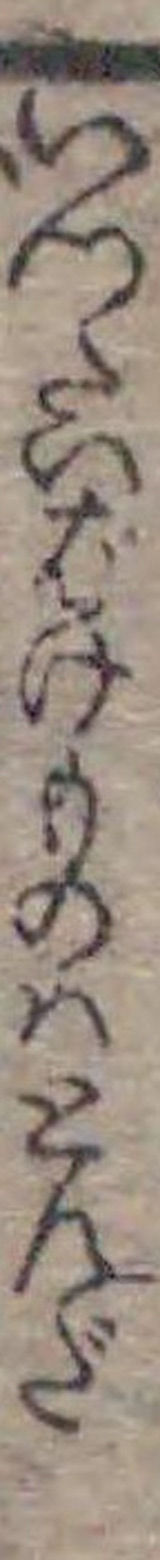いつたいばけものはとんだ
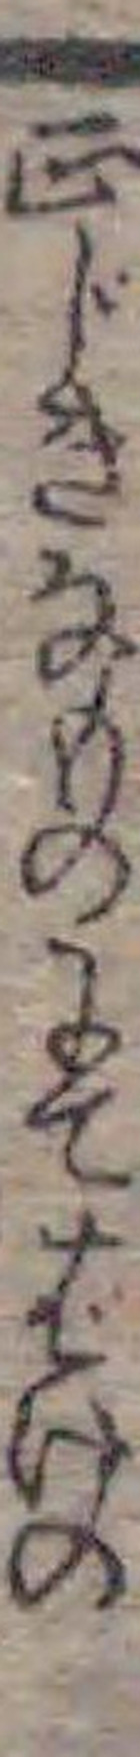正じきなものにてばけの
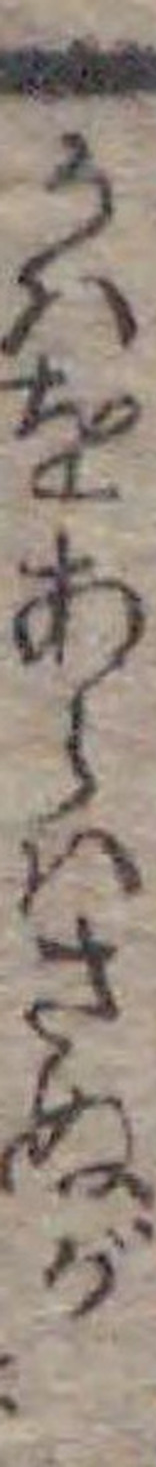かはをあらはさぬが
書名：年中行状記 : 2巻
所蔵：国立国会図書館 National Diet Library, JAPAN
